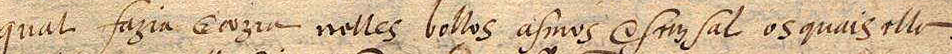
qual fazia e cozia nelles bollos asmos e sem sal os quais ella
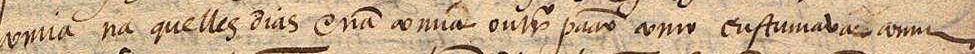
comia na quelles dias e nā comia outro paão como custumava comer
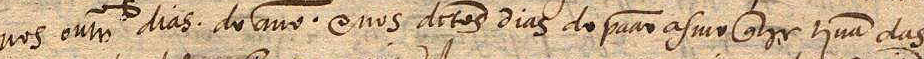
nos outros dias. do āno. e nos dc̄tos dias do paão asmo q̄ he hūa das
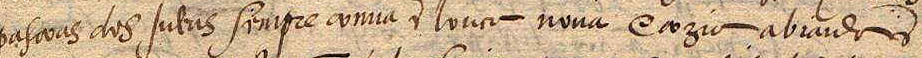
pascoas dos Judeus sempre comia ē louca noua e cozia a vianda ē
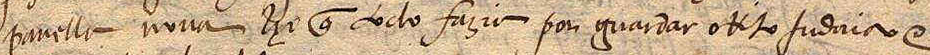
panella noua ho q̄ todo fazia por guardar o Rito Judaico e
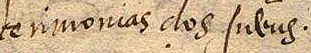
cerimonias dos Judeus.
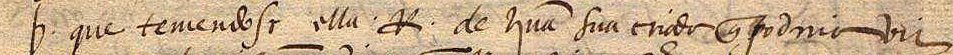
Pra. que temendose ella .R. de hūa sua criada q̄ poderia vir
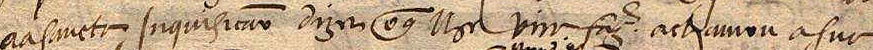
aa sancta Jnquisicão dizer o q̄ lhe vira faz̄. a chamou a sua
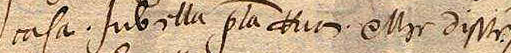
casa . Jndo ella p̄la Rua. e lhe disse
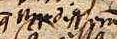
q̄ lhe disserā
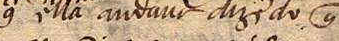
q̄ ella andaua dizēdo q̄
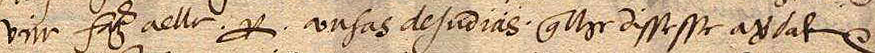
vira faz̄ a ella .R. cousas de Judias . q̄ lhe dissesse a ꝟdade e
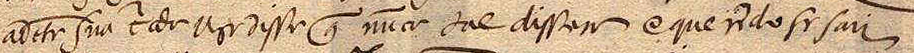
a d̄cta sua ciada lhe disse q̄ nūca tal dissera e querēdo se sair
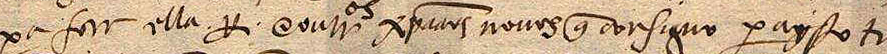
ꝑa fora ella .R. e outros Xpaãos nouos q̄ consiguo ꝑa ysto ti
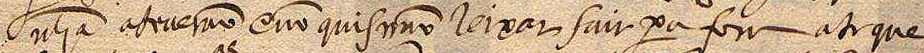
nhā a teuerão e n̄o quiserão leixar sair ꝑa fora ate que
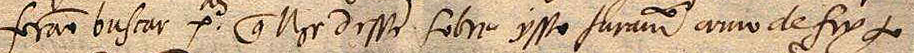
forão buscar pa.s q̄ lhe dessē sobre ysso Juramto como de feyto
